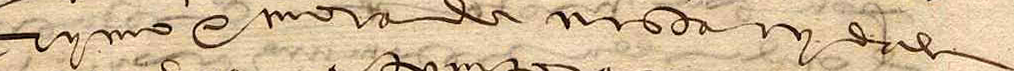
Cryme e morador nesta cydade
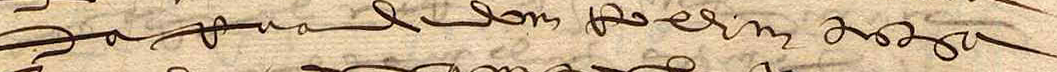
da Rua de dom Rollim testa
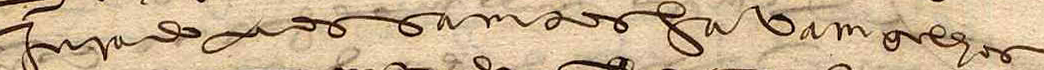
Jurado aos samtos havamgelhos
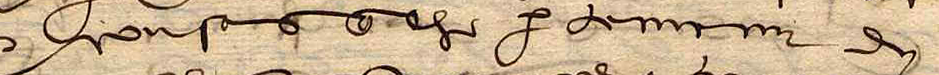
e cousas q̄ lhe ꝑtemçem dy
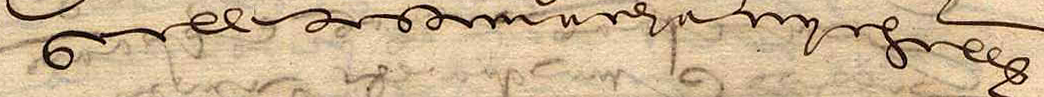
se elle testemunha nychell
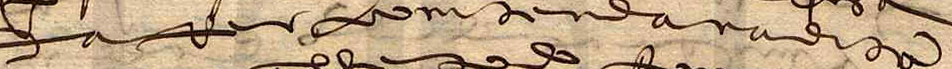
da Ree comteuda na ditā
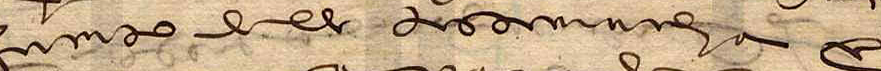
Jumto delle testemunha ē
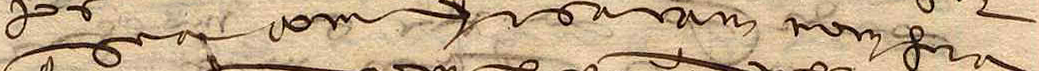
q̄ sua comvresaçam nom hera
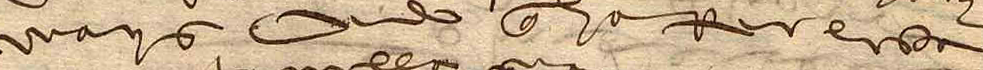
mays Cedo q̄ ha Ree e esta
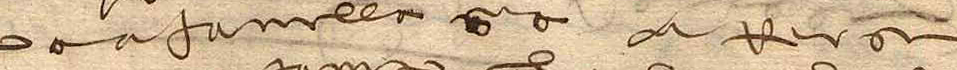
va a Janella sua a Ree se
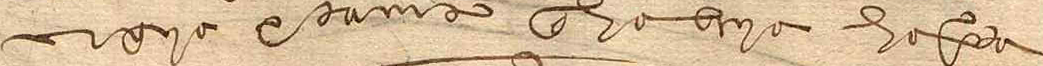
ergya e tamto q̄ habrya ha p̄ota
